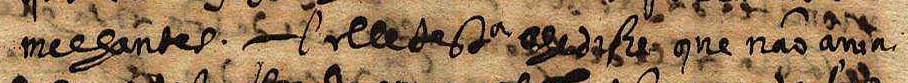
melhantes. E elle testa lhe disse que não auia
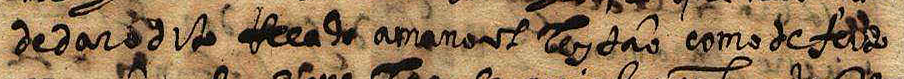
de dar o dito Recado a manoel leytão como de feito
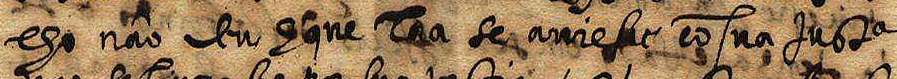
lho não deu E que laa se auiesse c̄o sua Justa
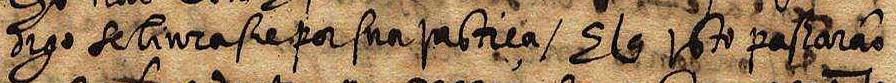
digo se liurasse por sua justiça / E q̄ isto passarão
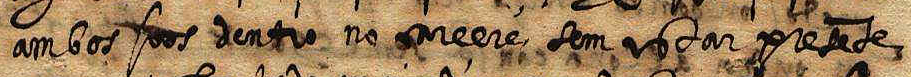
ambos soos dentro no carcere sem estar presēte
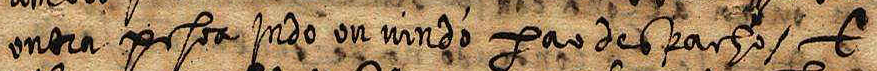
outra pesoa jndo ouuindo ꝑa o despacho / E
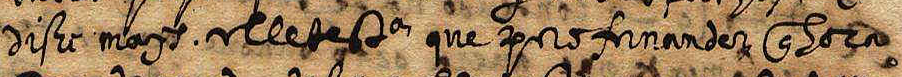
disse mays elle testa que pero fernandez q̄ hora
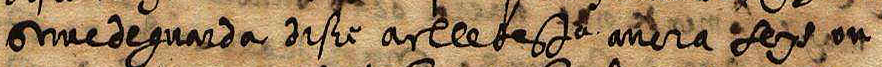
serue de guarda disse a elle testa auera seys ou
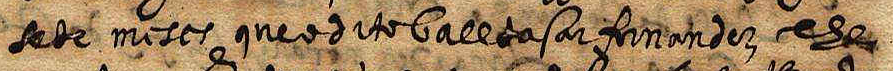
sete meses que o dito balltasar fernandez lhe
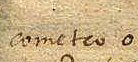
cometeo o
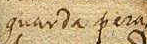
guarda pera
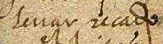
leuar recado
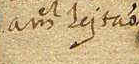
a mel lejtaõ
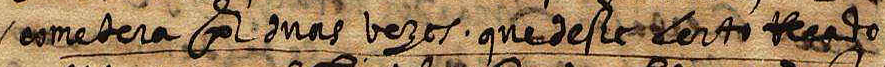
cometera por duas vezes que desse certo Recado
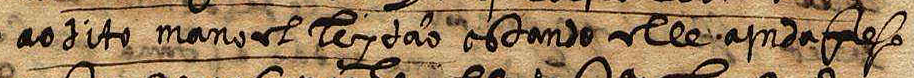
ao dito manoel leytão estando elle ajnda preso
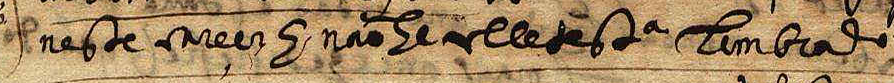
neste carcer E não he elle testa lembrado
